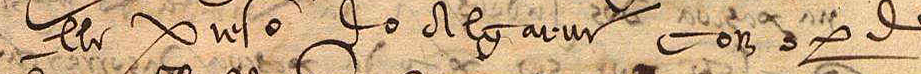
elle preso do Algarue com o Ldo
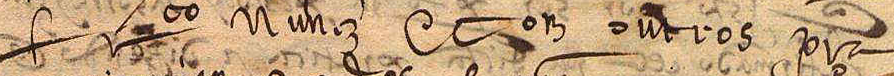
frco nun̄ez e com outros pra
